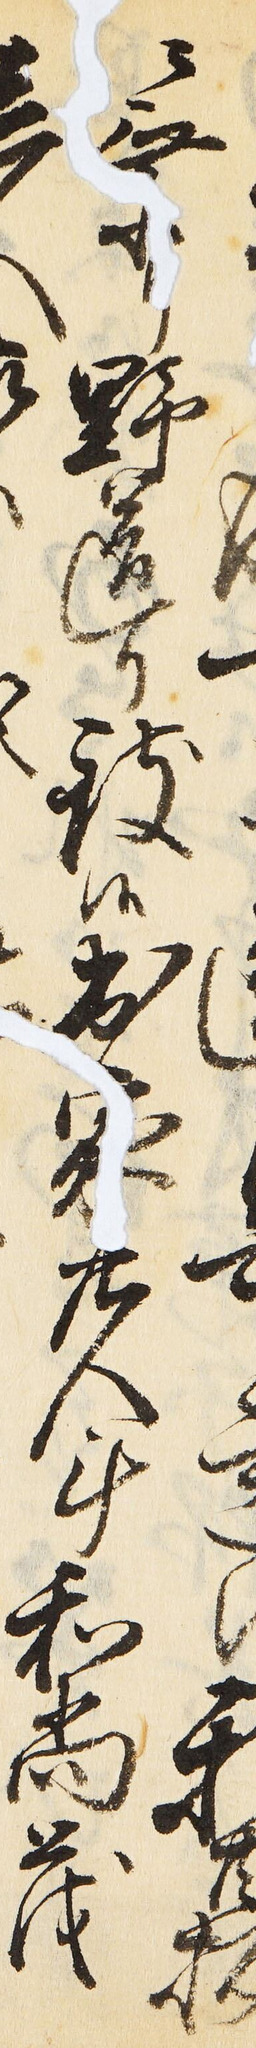ニ乗り野送り致候出廿人計和尚茂
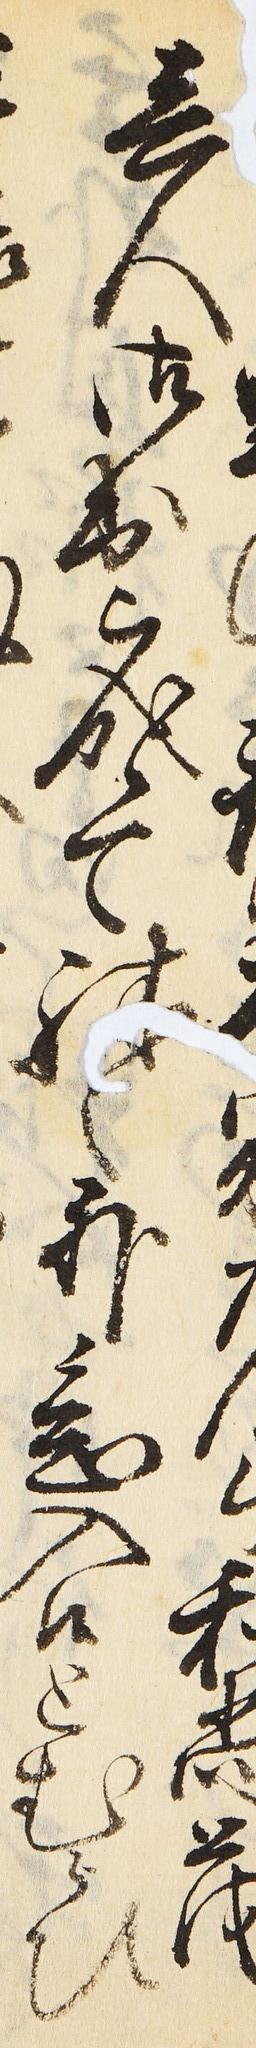壱人御出被成候て殊之外念入候とむらひ
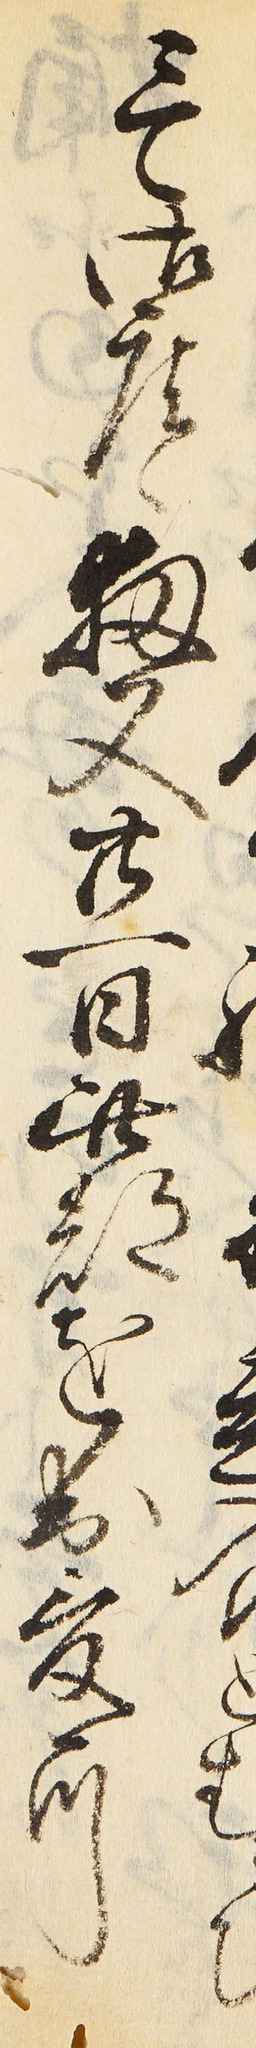ニて御座候扨又廿一日此都を出夏川
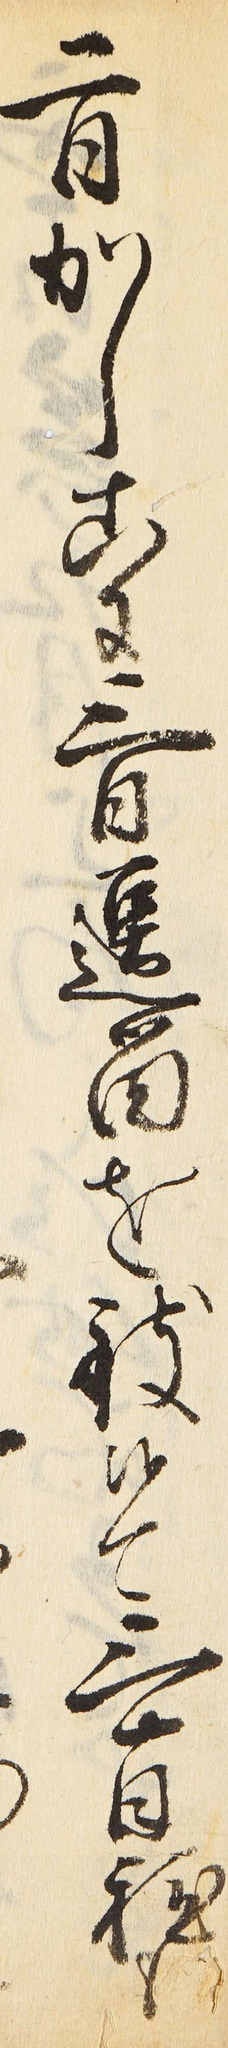二日かしこに三日逗留を致候て三十日程も
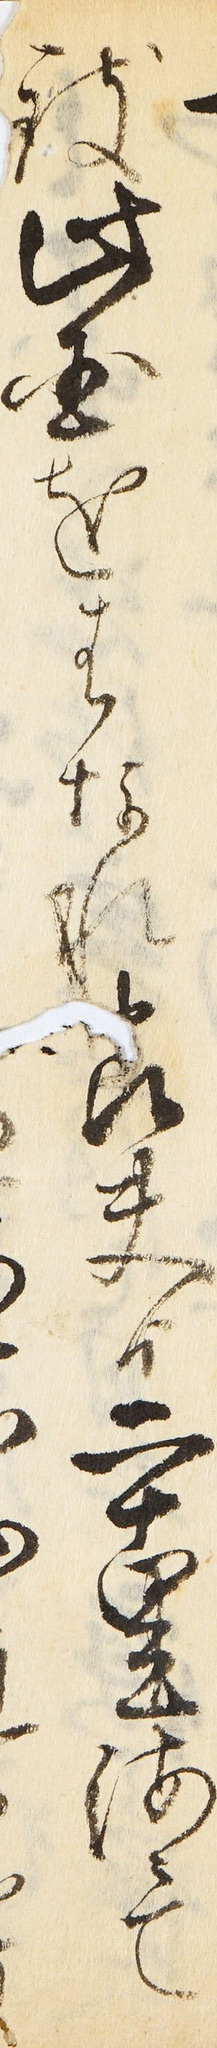致此国をはなれ申候夫ゟ二十里海ニて
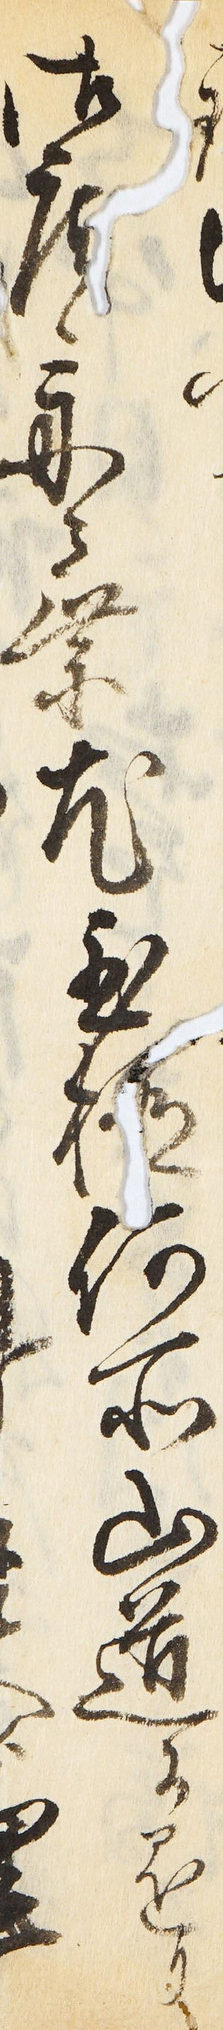御座候舟ニ乗尤至極何所山道に懸り
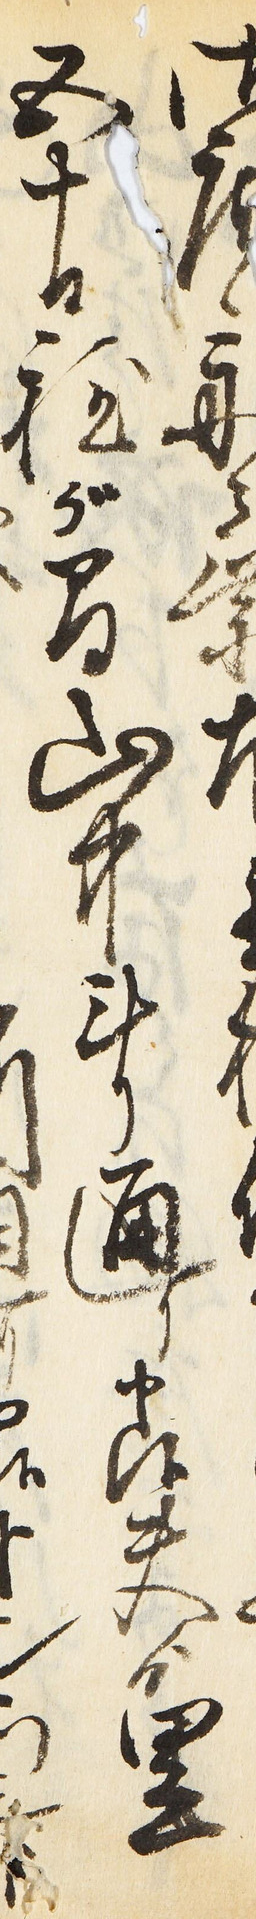五十日程が間山中計り通り申候夫ゟ里
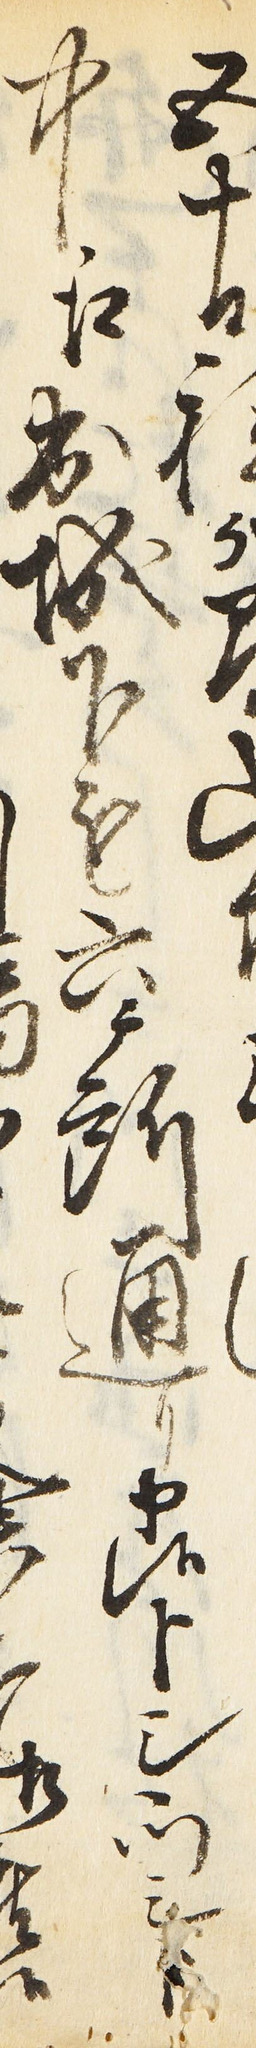中江出城下を六ヶ所通り申候トシヽツシ
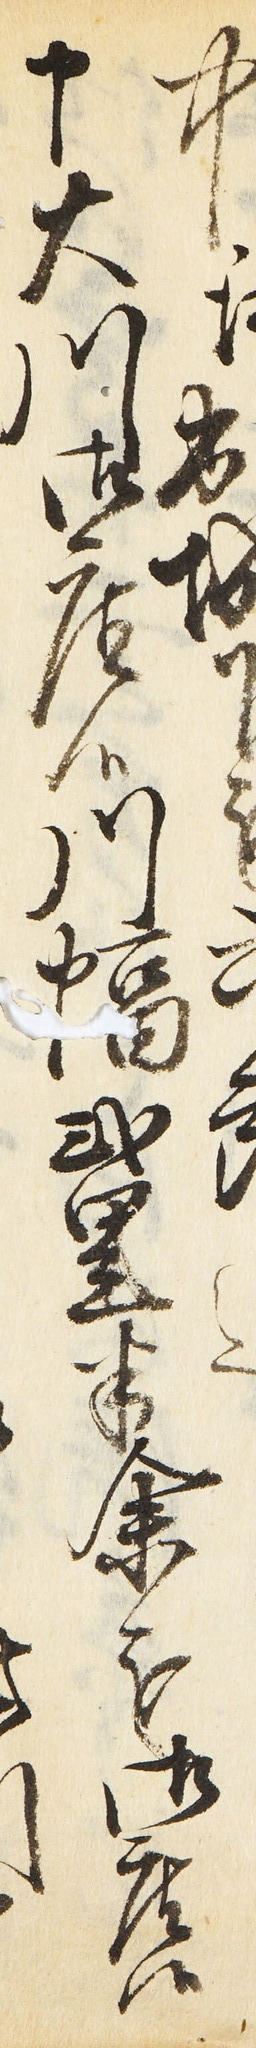申大川御座候川幅弐里半余も御座候
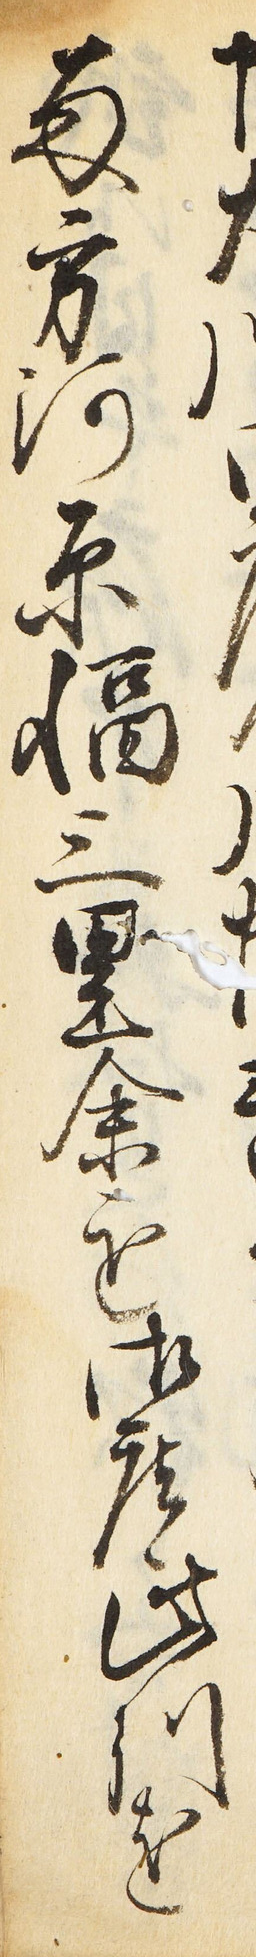両方河原幅三里余も御座候此川を

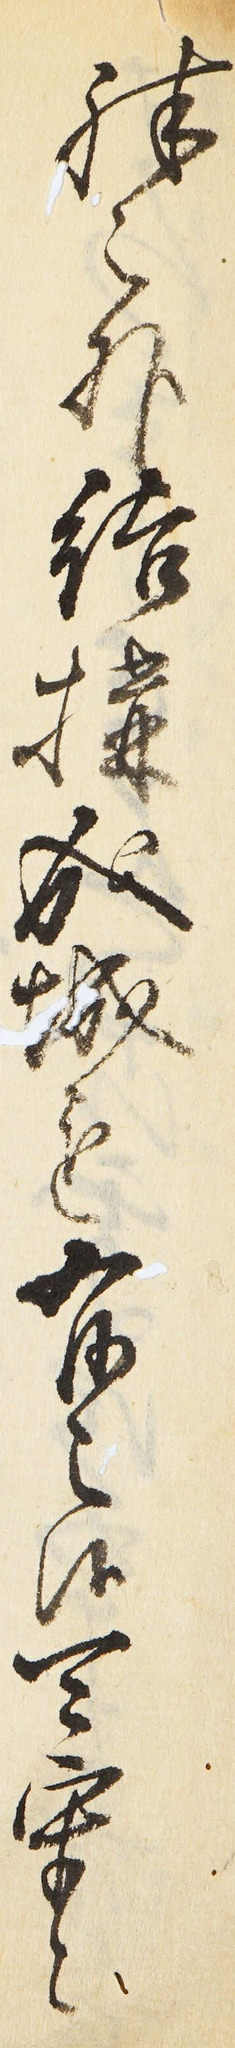殊之外結構成城も有之候天守と
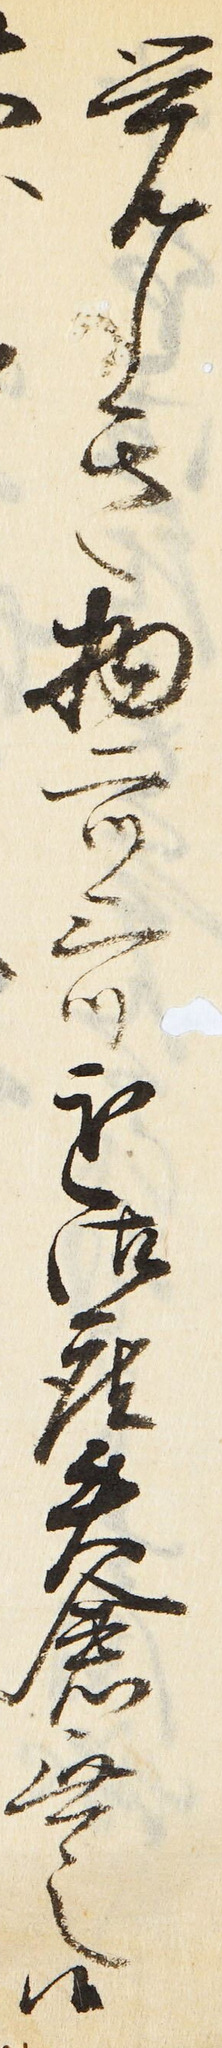覚しき物二ツ三ツも御座矢倉無之候
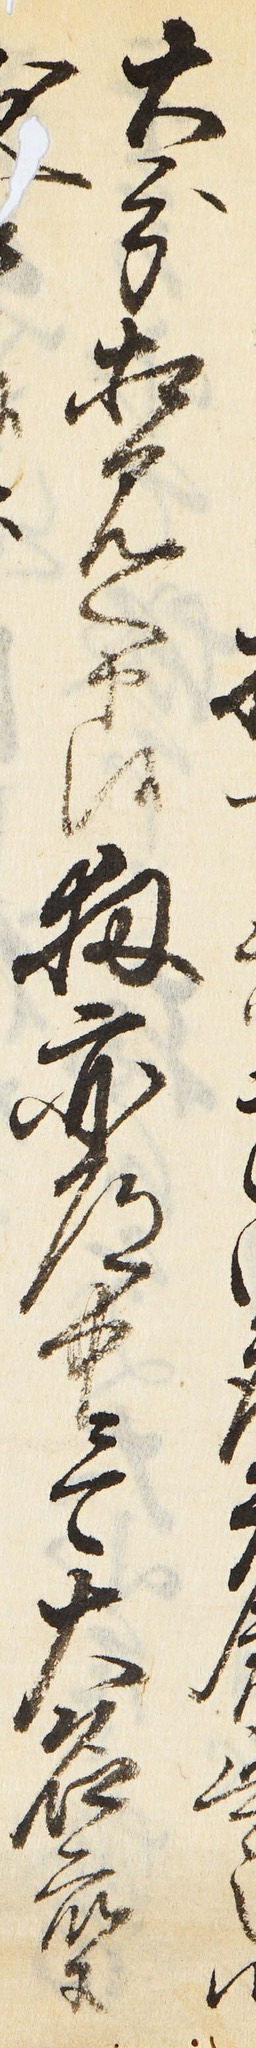大分相見へ申候扨亦道中ニて大名衆に
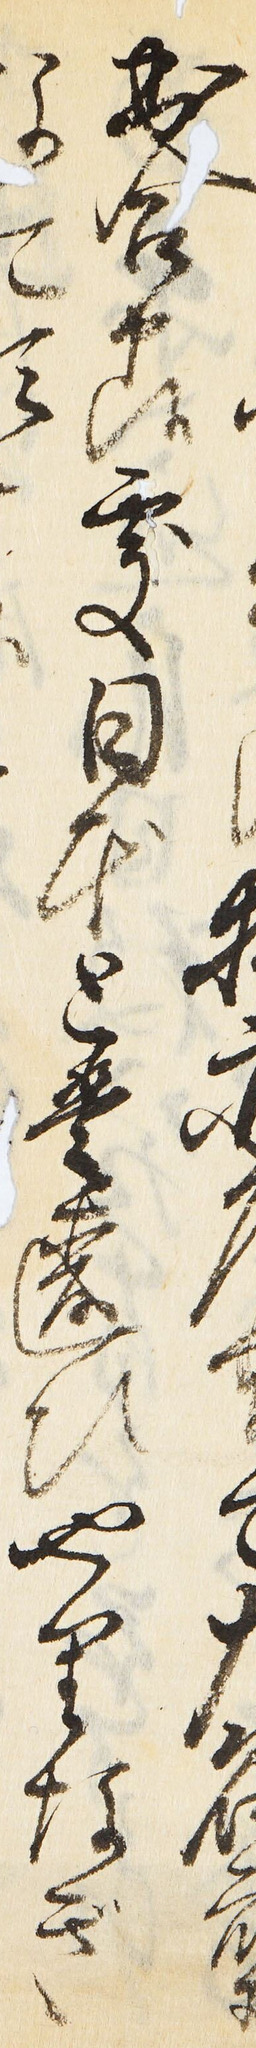出合申候処日本とは違ひやりなぎ
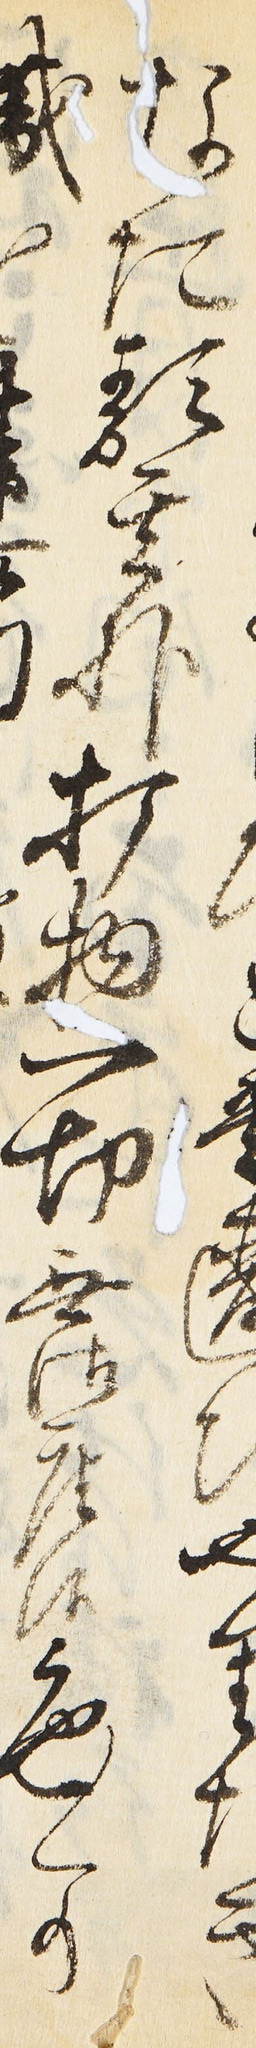なた類其外打物一切無御座候色々の
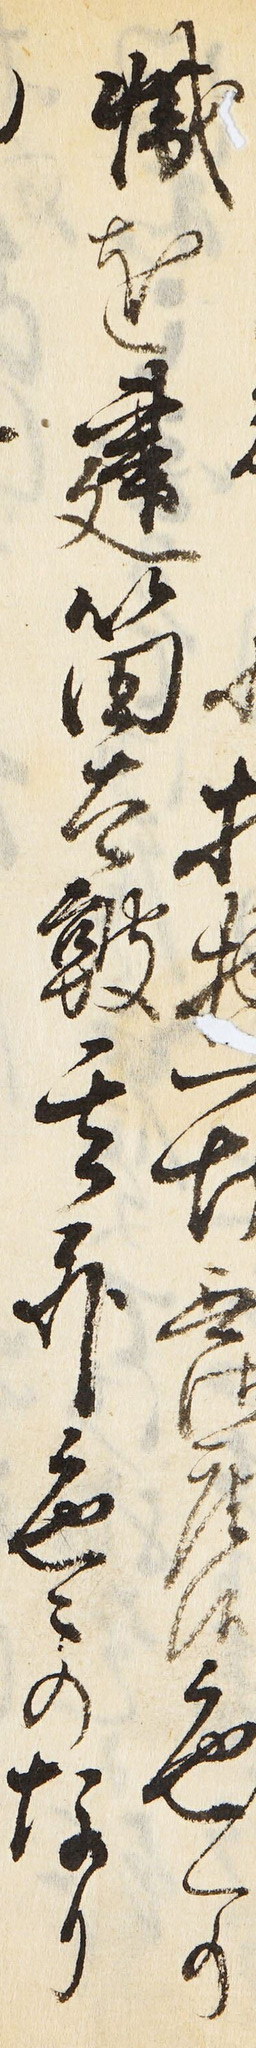幟を建笛太鼓其外色々のなり
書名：志州鳥羽船頭外国江吹流し候一件
